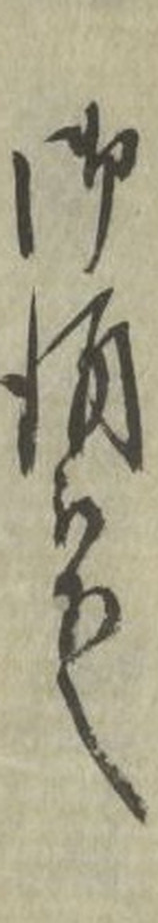御酒被下之
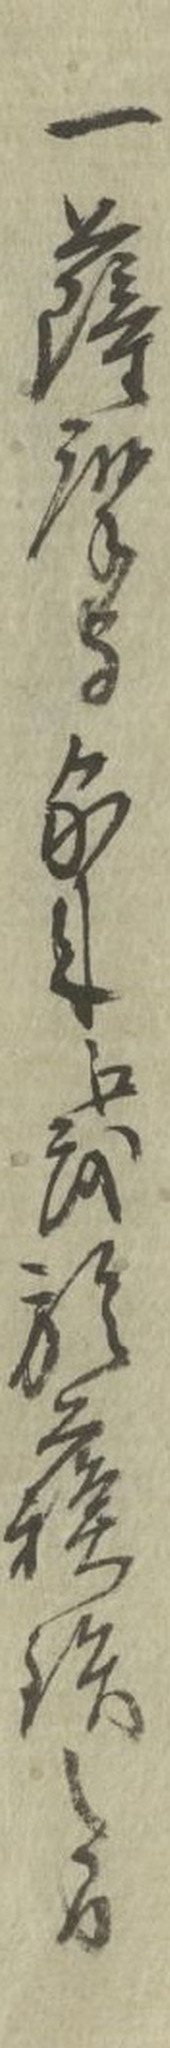一薩摩守家来えも於蘇鉄之間
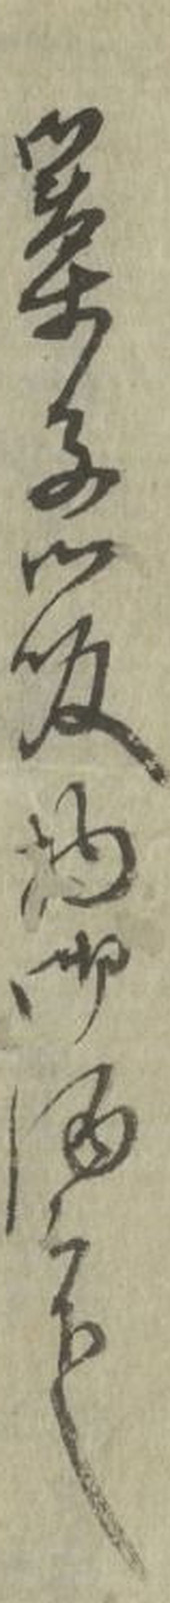御菓子御吸物御酒被下之

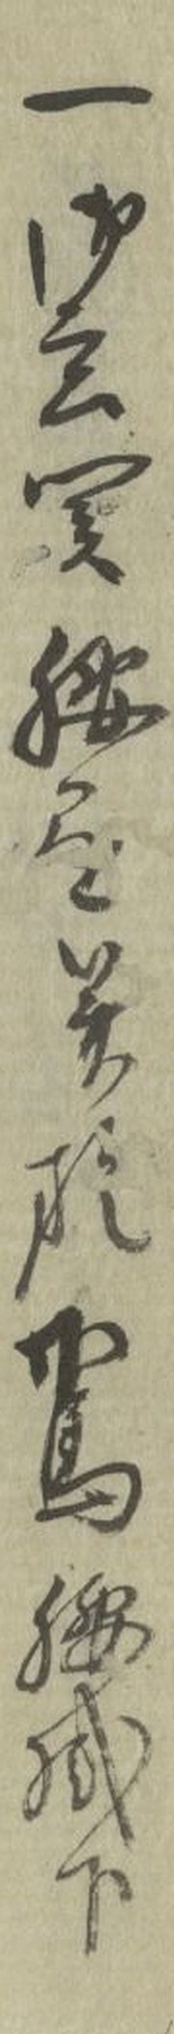一御玄関腰懸幷於下馬腰掛下
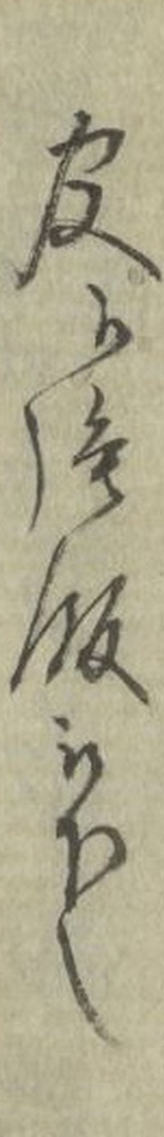官え強飯被下之
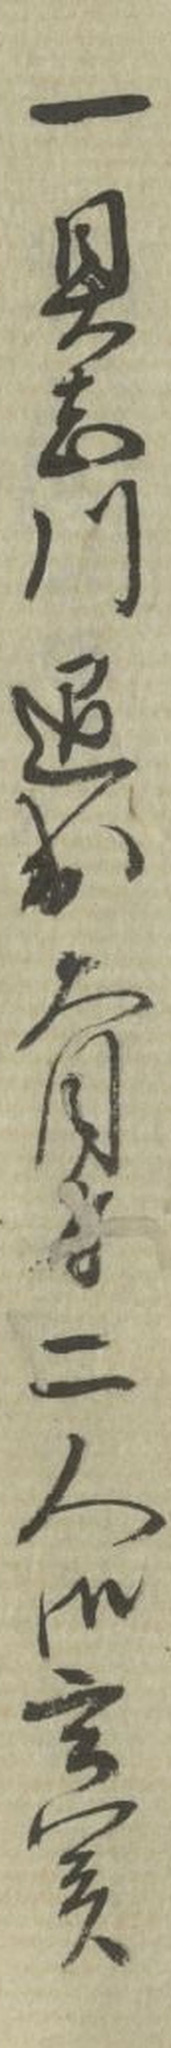一具志川退出大目付二人御玄関
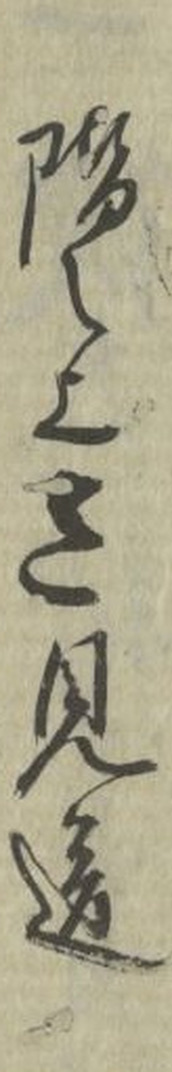階之上迄見送
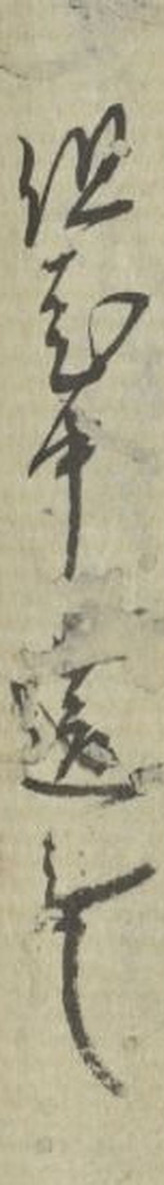但老中送無之
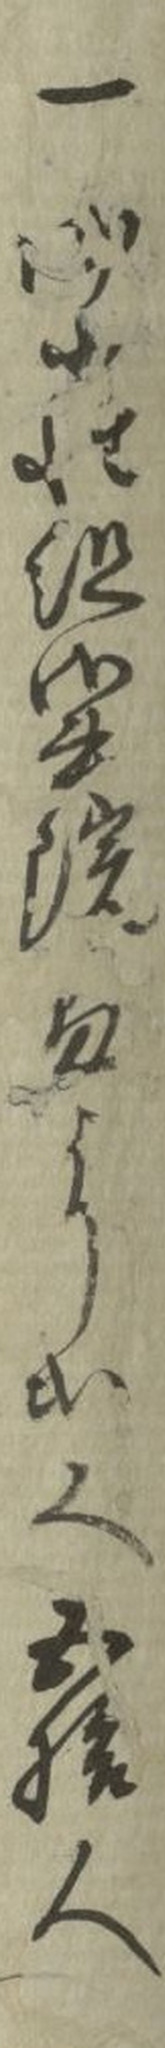一御小姓組御書院番より出人五拾人
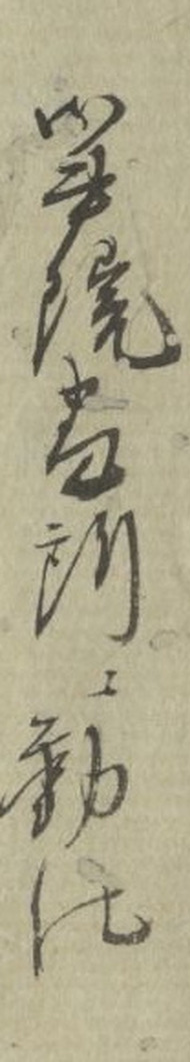御書院番所に勤仕
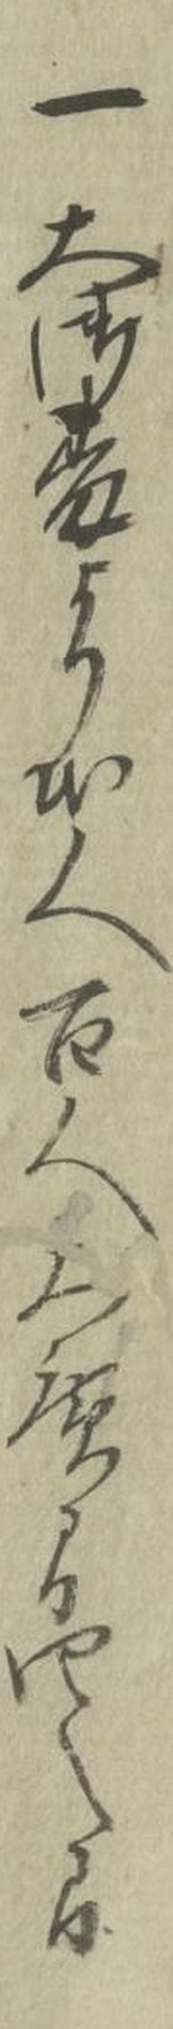一大御番より出人百人大広間四之間

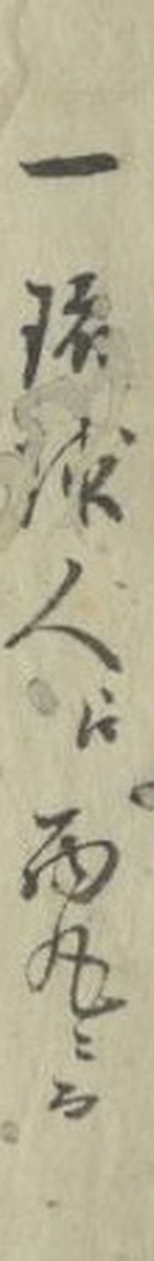一琉球人え西丸に而
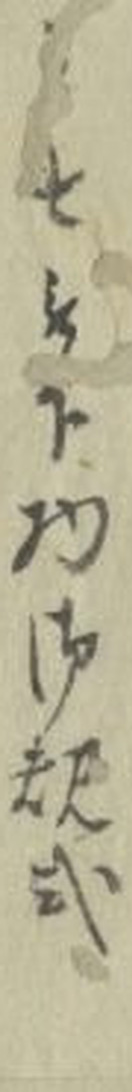被遣被下物御規式
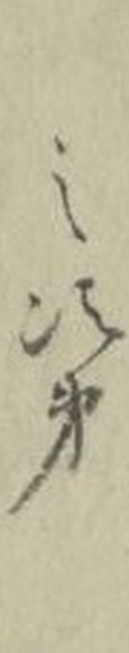之次第
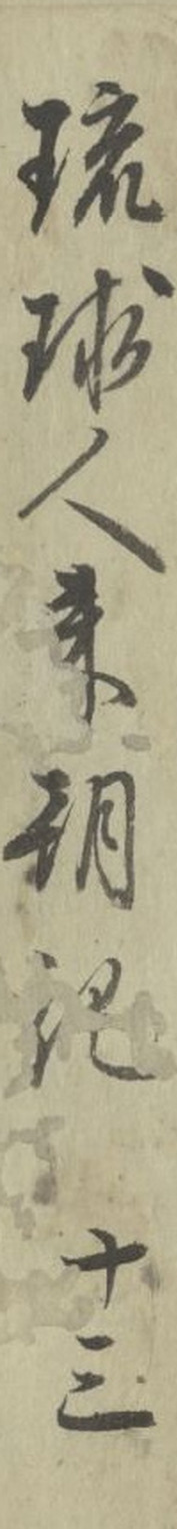琉球人来朝記十三

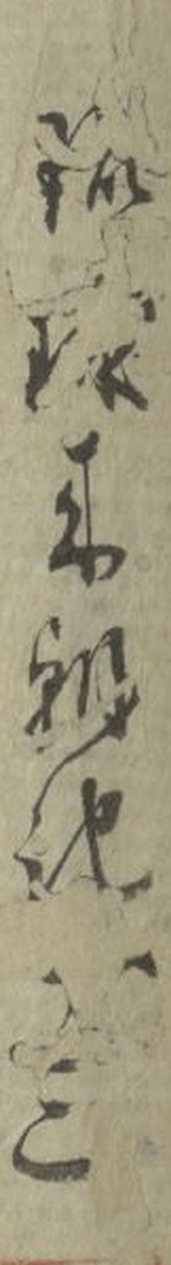琉球来朝記十三
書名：琉球来朝記 自八至十四終
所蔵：University of the Ryukyus Library
